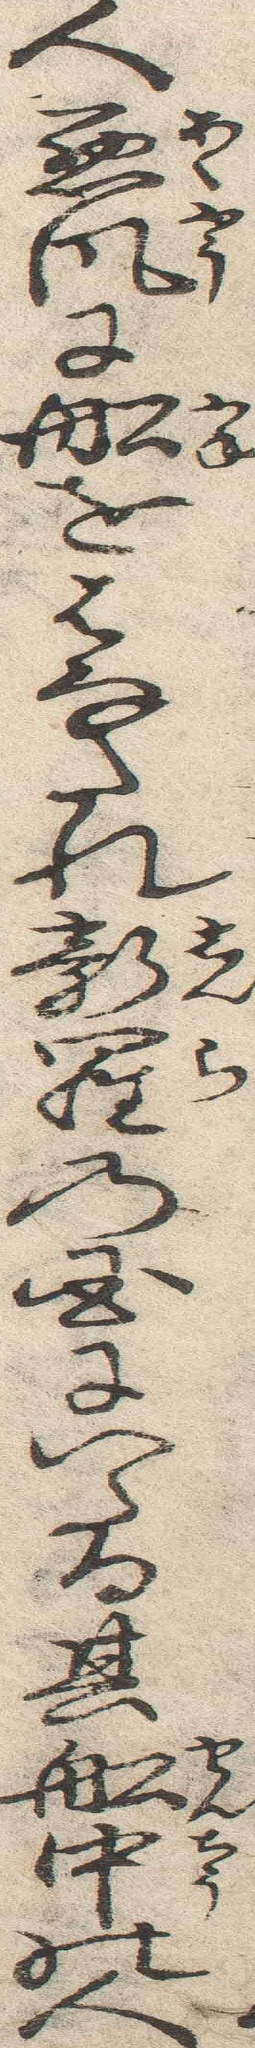人悪風に船をはなたれ新羅の国にいたる其船中の人
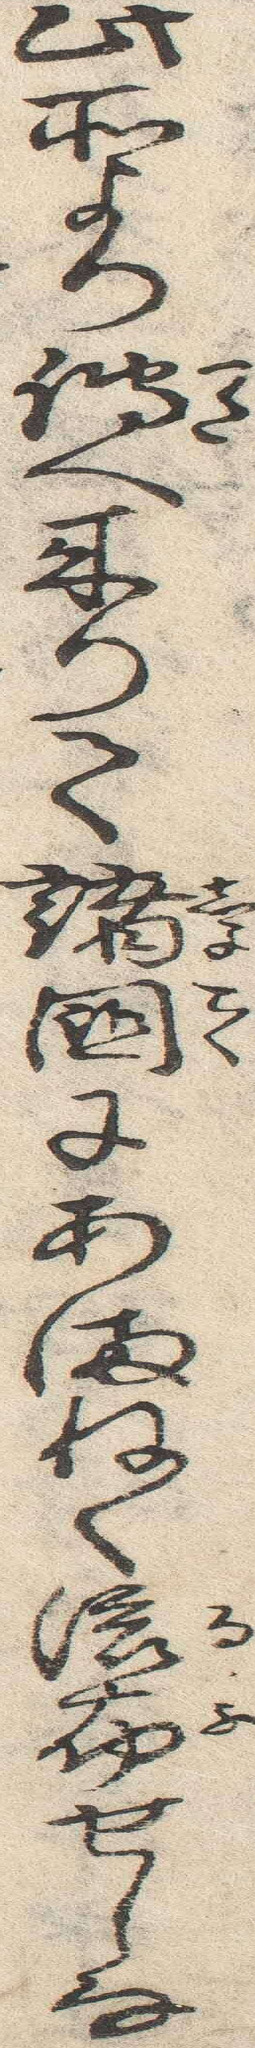此所より伝へ来りて諸国にあまねく流布せしな
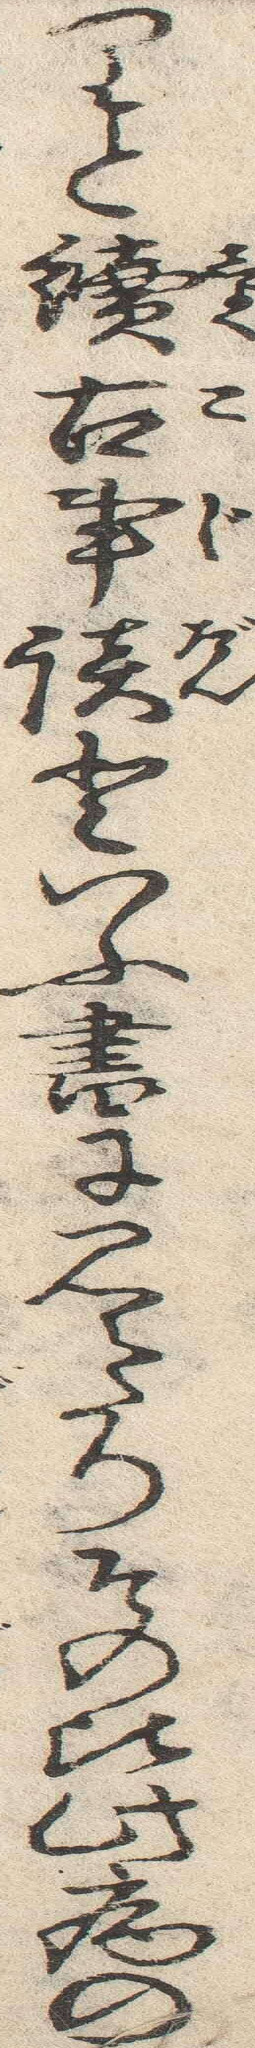りと続古事談といふ書に見えたりその比此病の
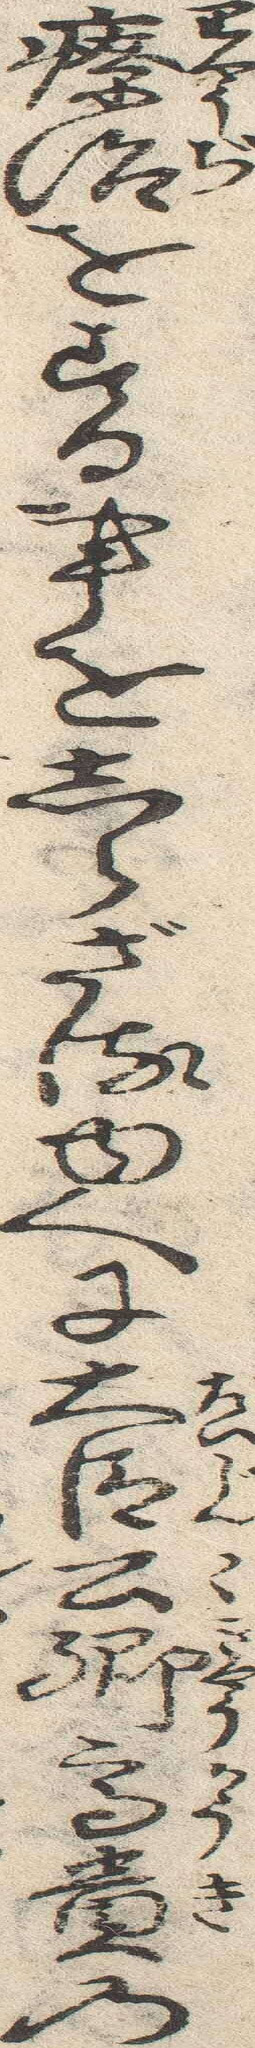療治をする事をしらざるゆへに大臣公卿高貴の
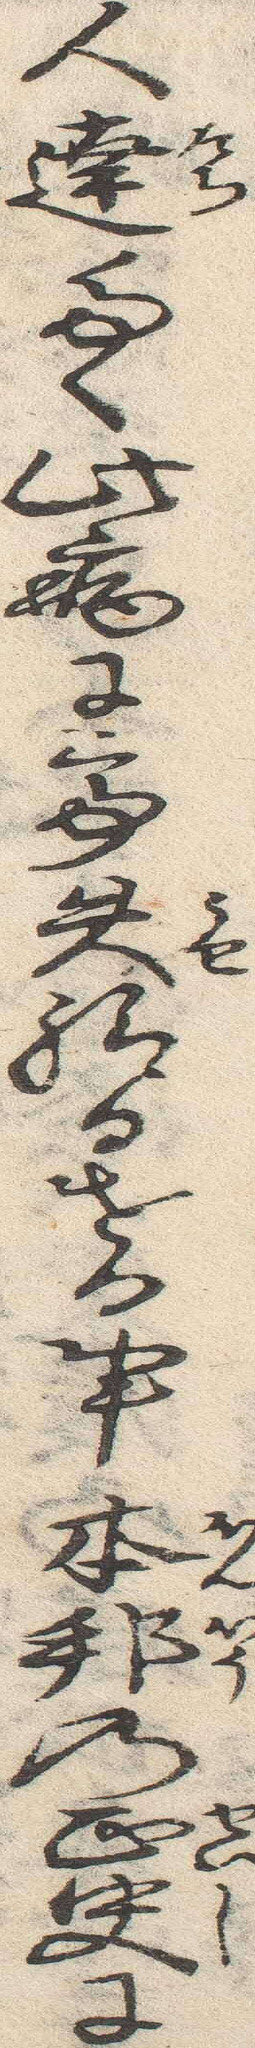人達多く此病にて失給りける事本邦の正史に
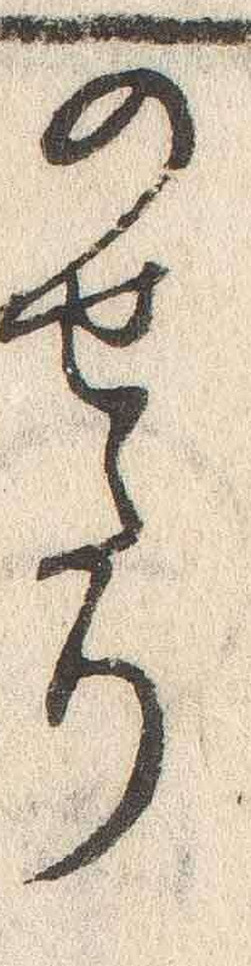のせたり
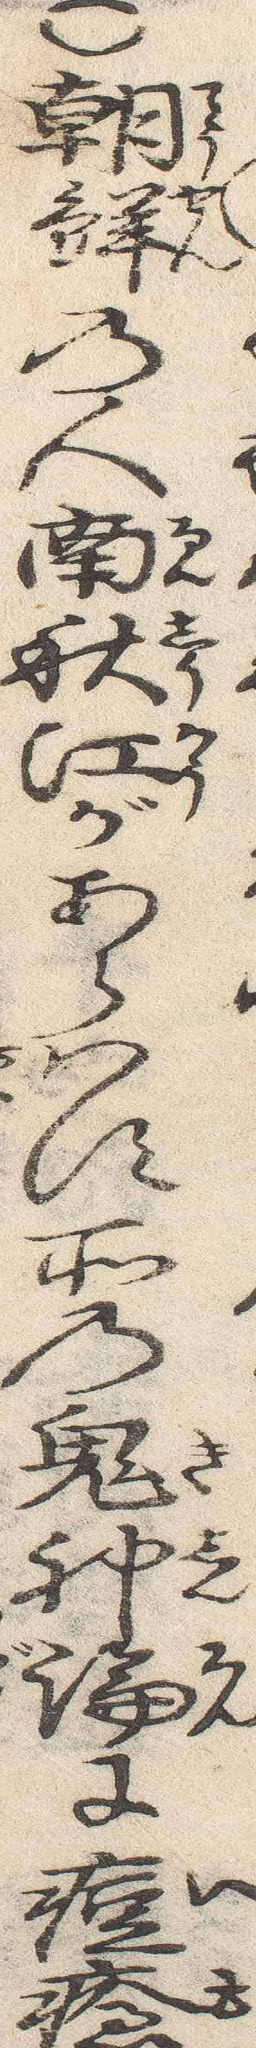○朝鮮の人南秋江があらはす所の鬼神論に痘瘡
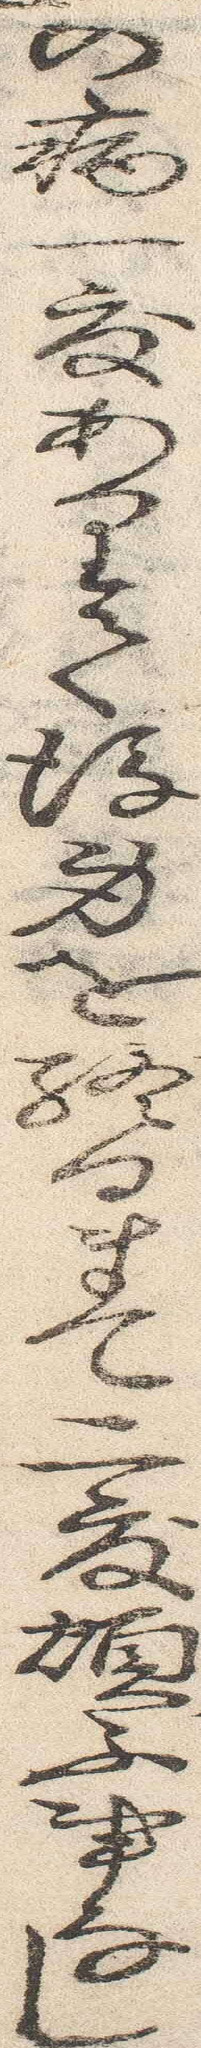の病一度ありて後身を終るまて二度煩ふ事なし
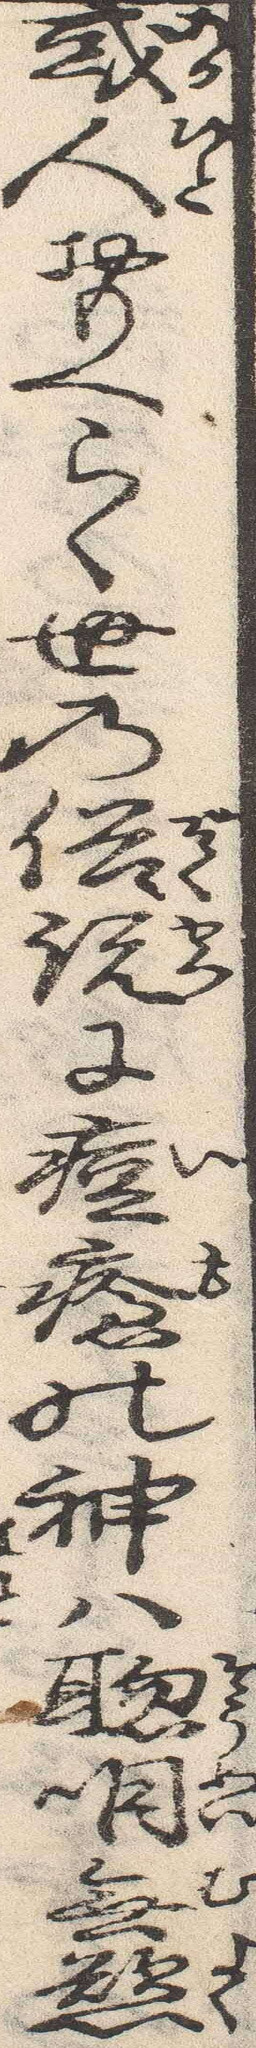或人おもへらく世の俗説に痘瘡の神は聡明無欲
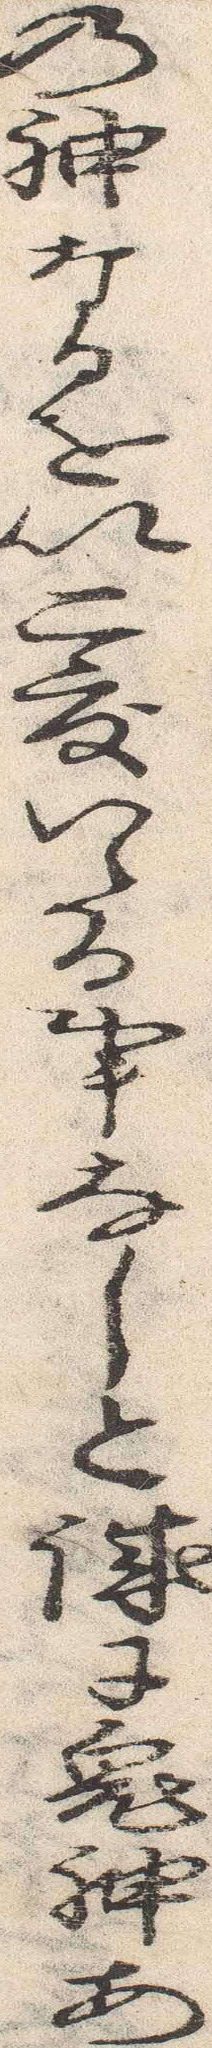の神なるを以二度いたる事なしと誠に鬼神あ
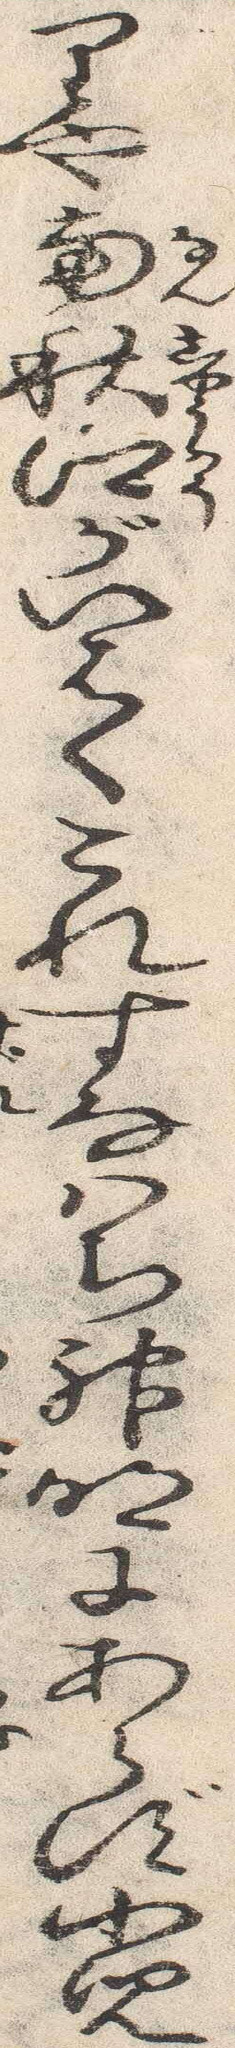りや南秋江がいはくこれすなはち神明にあらず小児
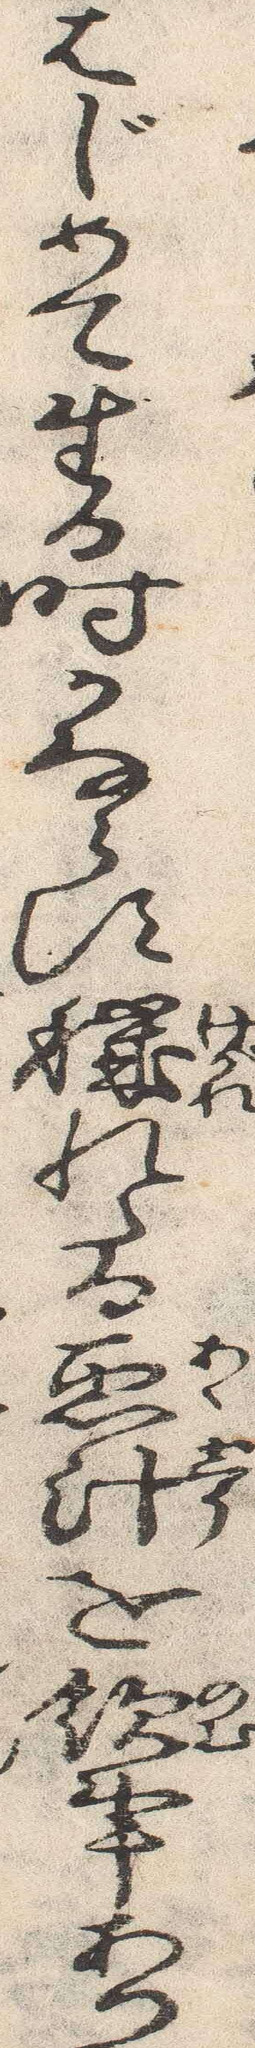はじめて生る時かならす穢れたる悪汁を飲事あり
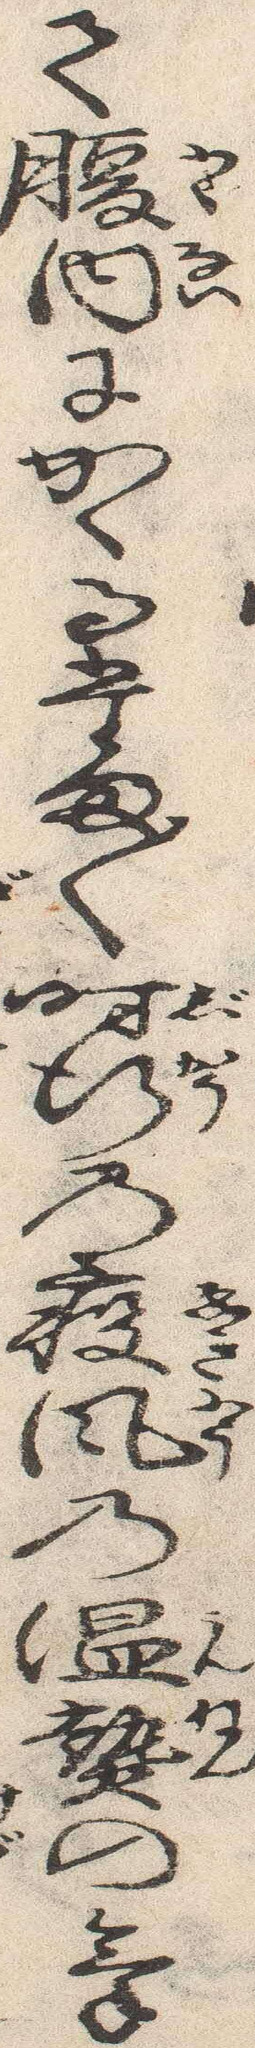て腹内にかゝる事多く時行の疫風の温熱の気
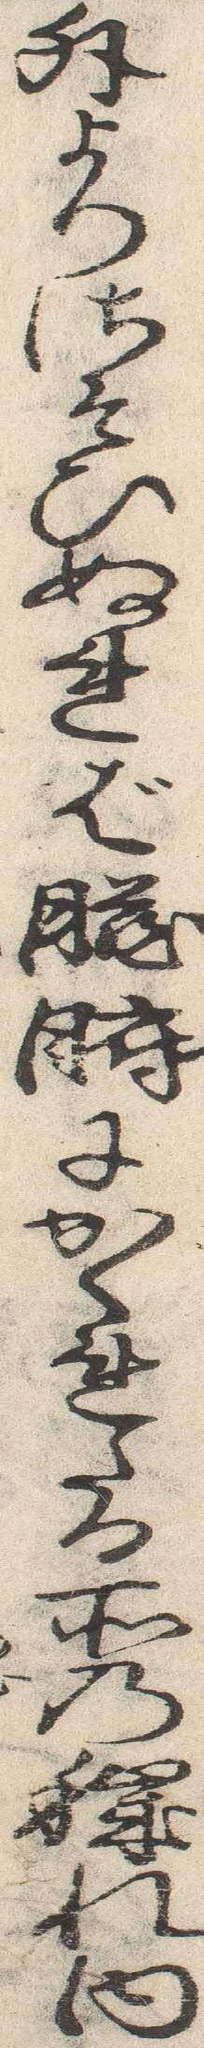外よりさそひぬれば臓腑にかくれたる所の穢れ内
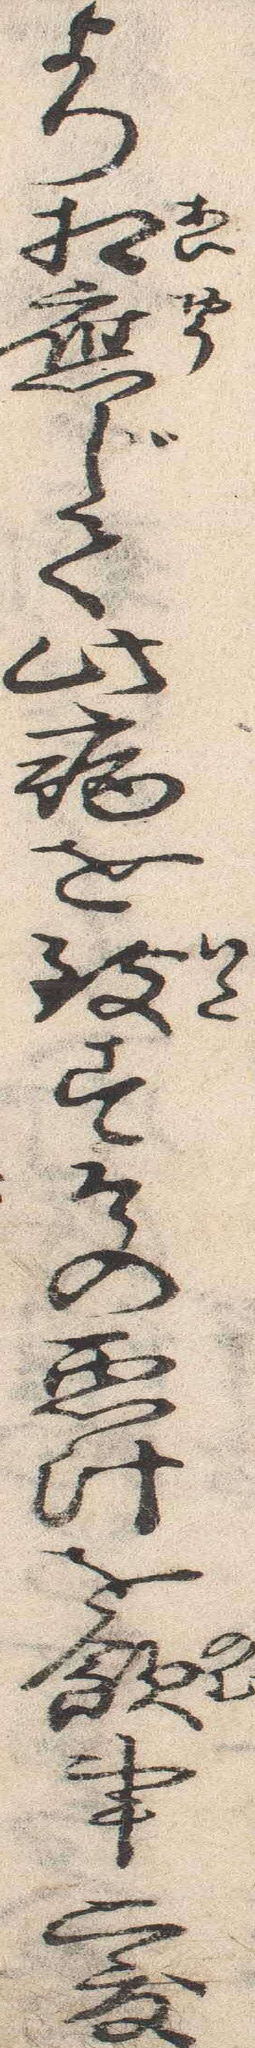より相応じて此病を致すその悪汁を飲事二度
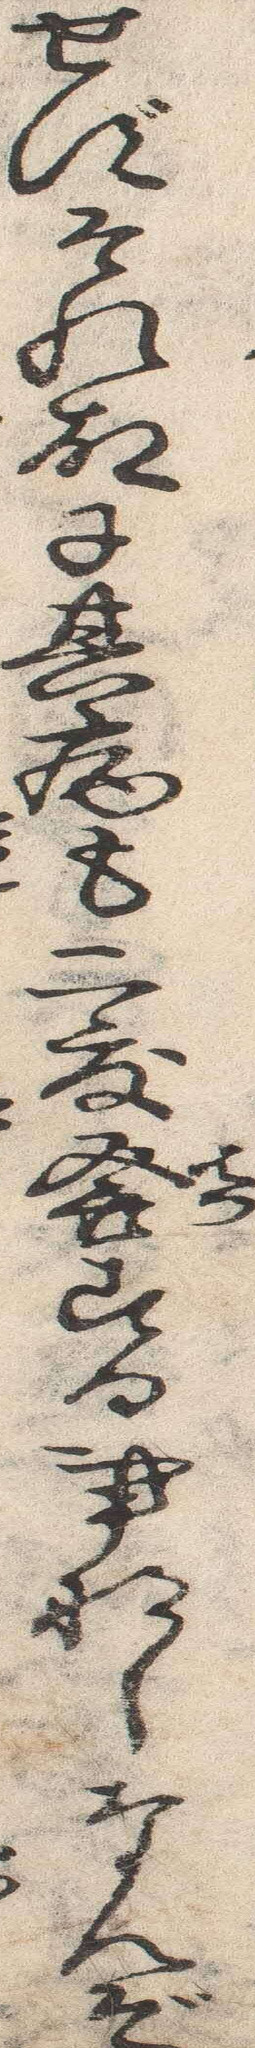せずそれ故に其病も二度発する事なしなんぞ
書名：小児必用養育草
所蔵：東京学芸大学附属図書館 国文学研究資料館
